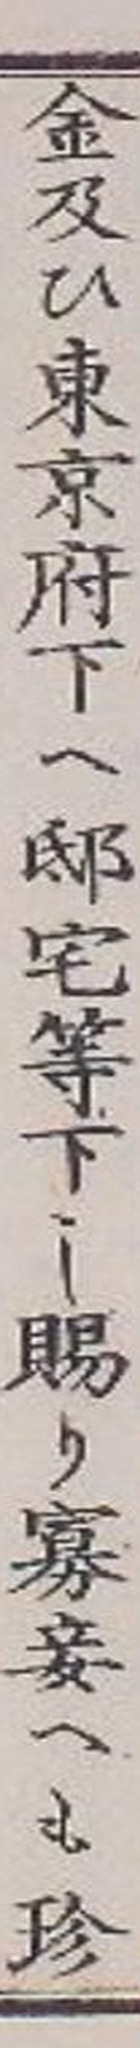金及ひ東京府下へ邸宅等下し賜り寡妾へも珍
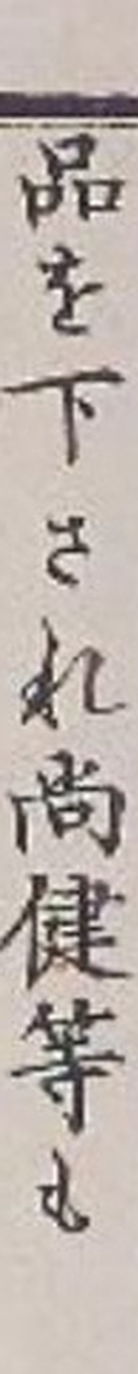品を下され尚健等も
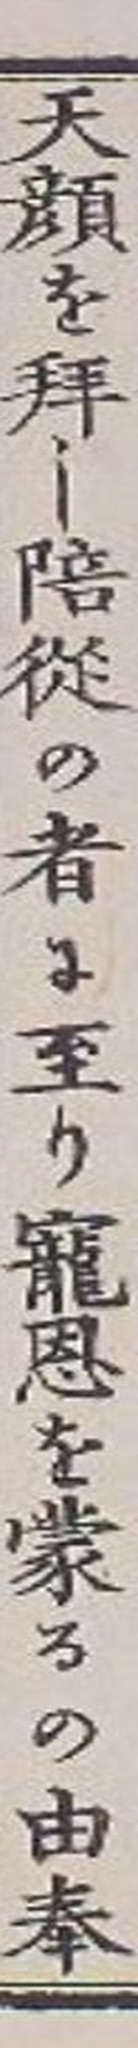天顔を拝し陪従の者に至り寵恩を蒙るの由奉
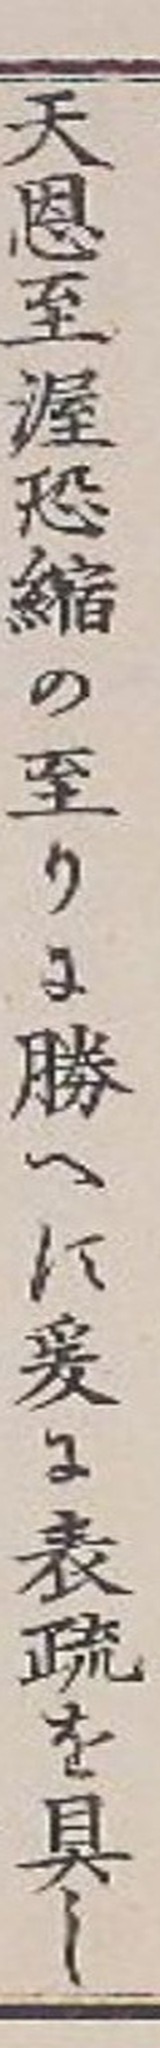天恩至渥恐縮の至りに勝へす爰に表疏を具し
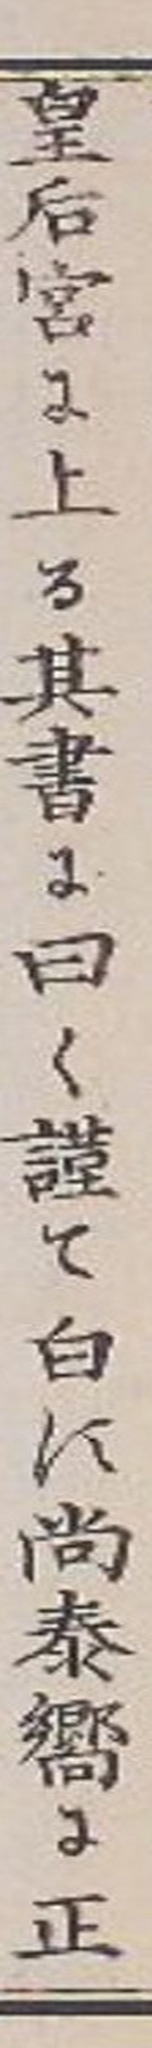皇后宮に上る其書に曰く謹て白す尚泰向に正
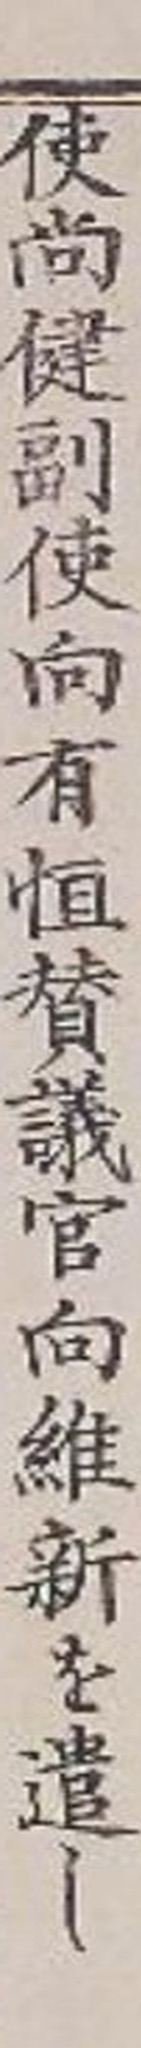使尚健副使向有恒賛議官向維新を遣し
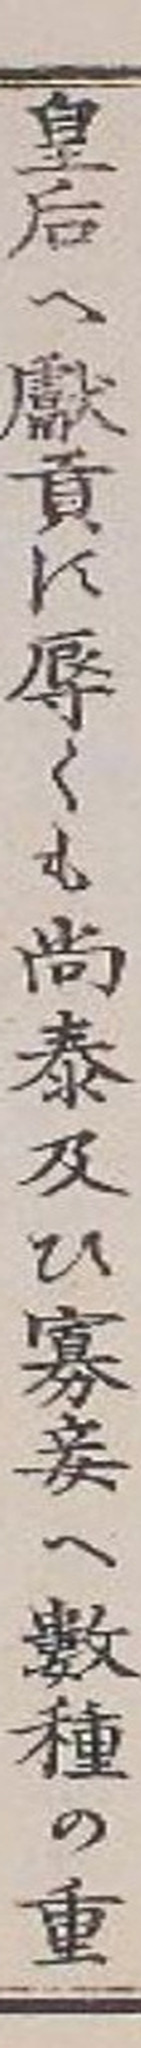皇后へ献貢す辱くも尚泰及ひ寡妾へ数種の重
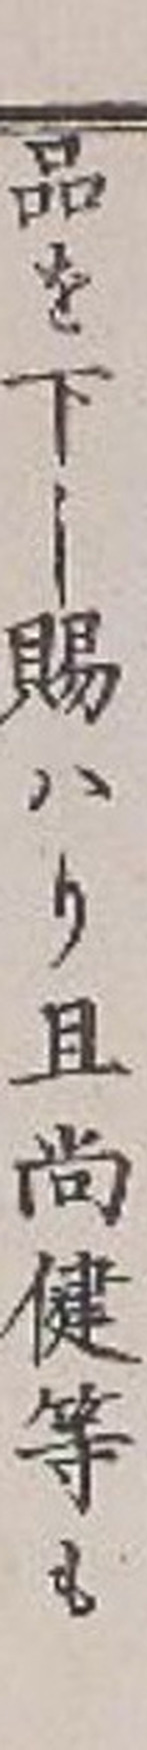品を下し賜は且り尚健等も
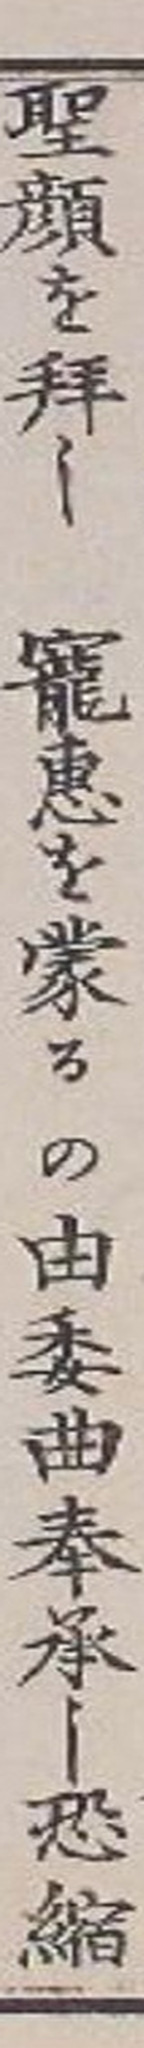聖顔を拝し寵恩を蒙るの由委曲奉承し恐縮
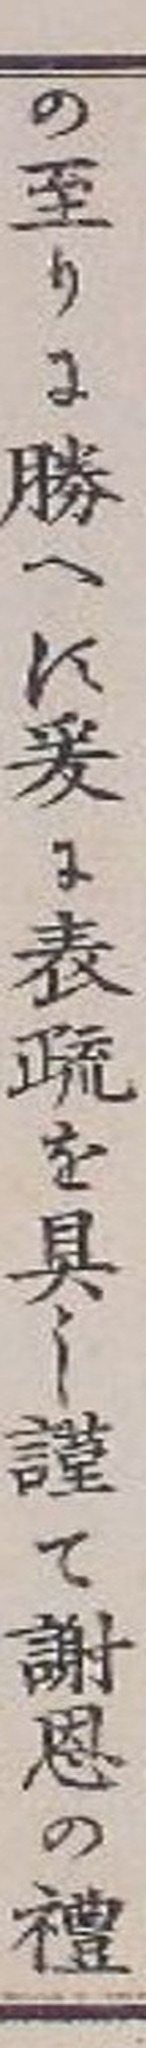の至りに勝へす爰に表疏を具し謹て謝恩の礼

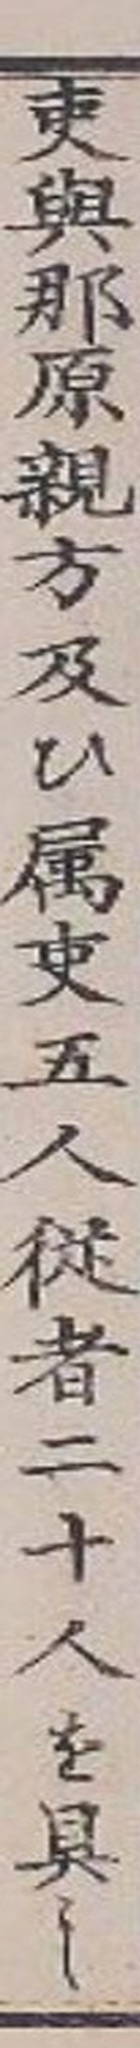吏与那原親方及ひ属吏五人従者三十人を具し
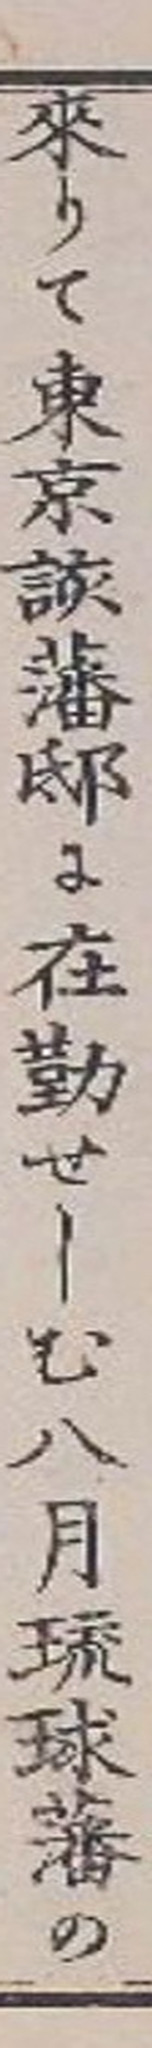来りて東京該藩邸に在勤せしむ八月琉球藩の
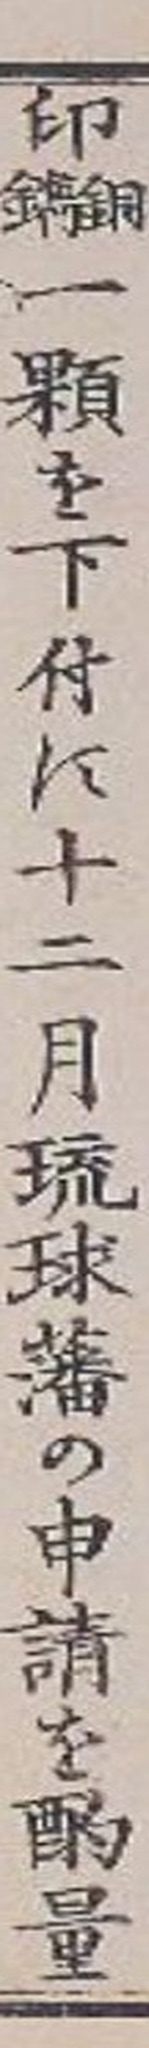印銅一顆を下付す十二月琉球藩の申請を酌量
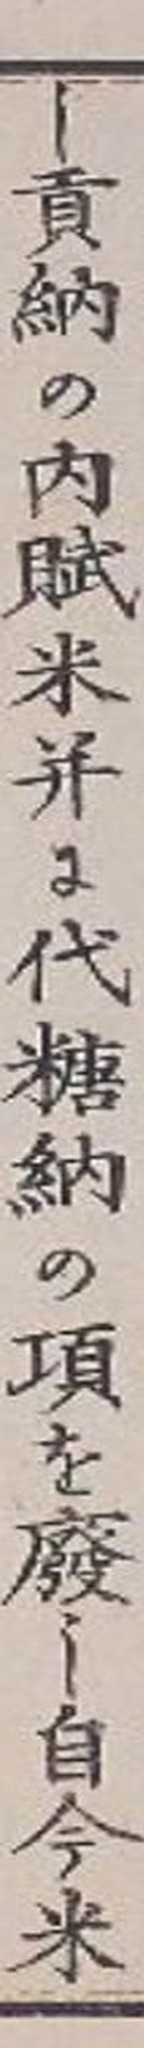し貢納の内賦米並に代糖納の項を廃し自今米
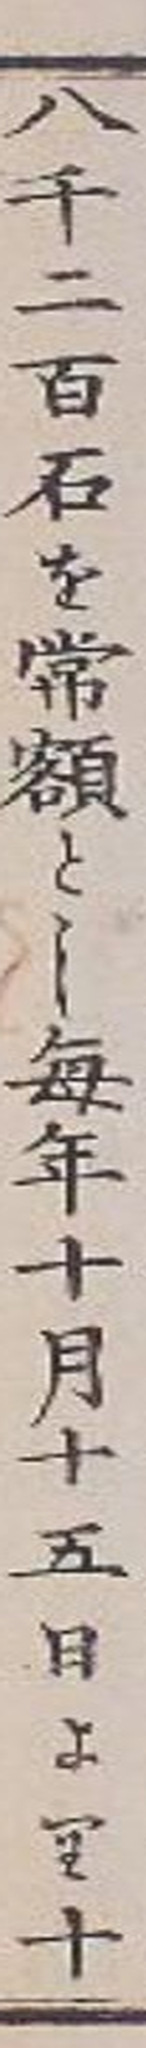八千二百石を常額とし毎年十月十五日より十
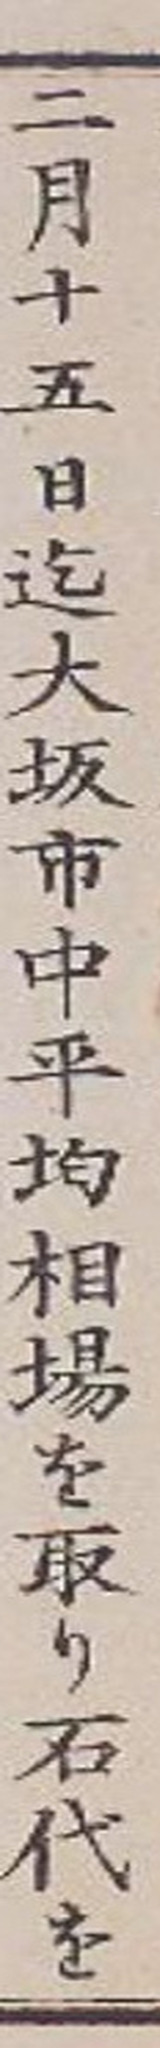二月十五日迄大阪市中平均相場を取り石代を
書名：南島紀事 下
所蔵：University of the Ryukyus Library
